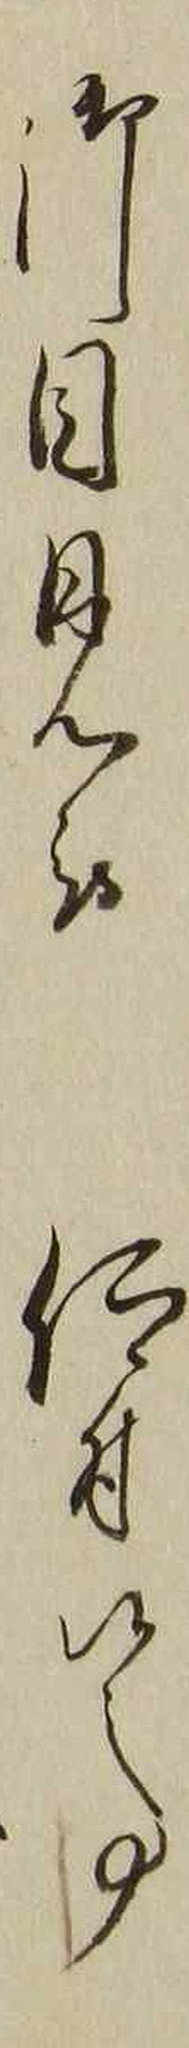御目見被仰付候事
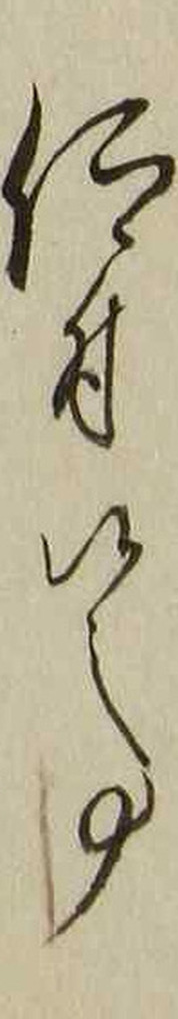仰付候事
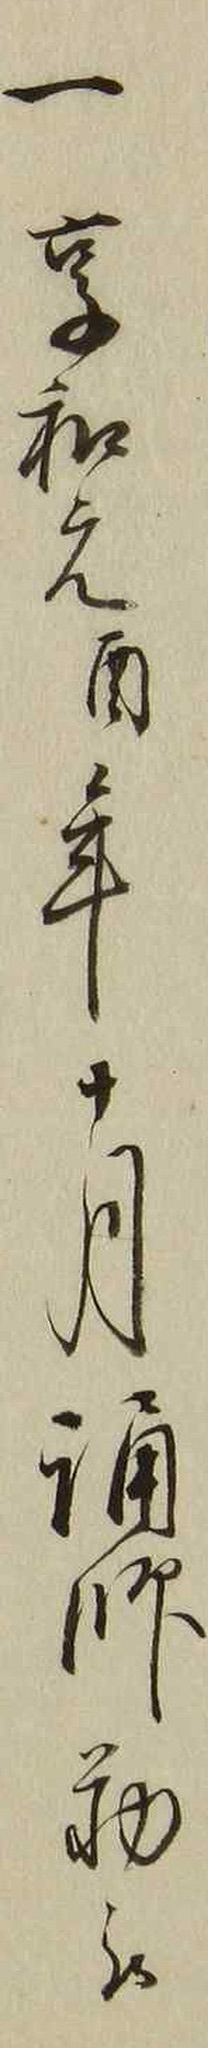一享和元酉年十月誦師勤被
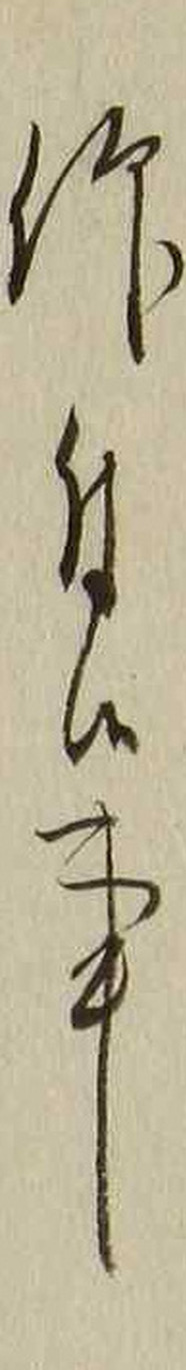仰付候事
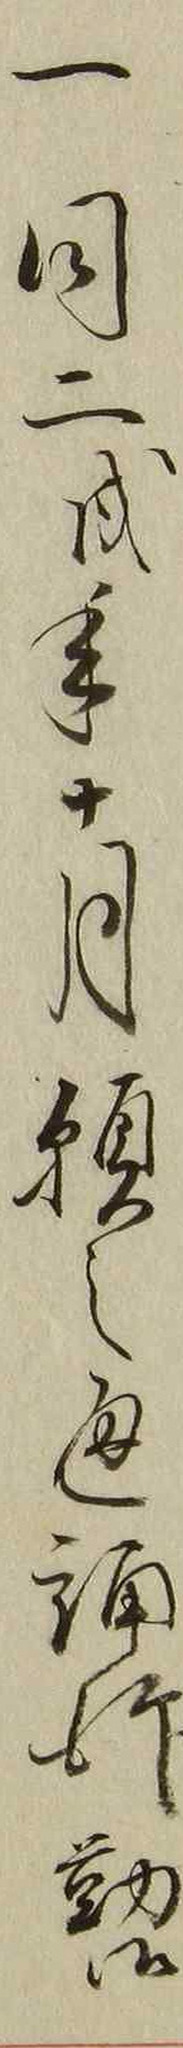一同二戌年十月願之通誦師勤御
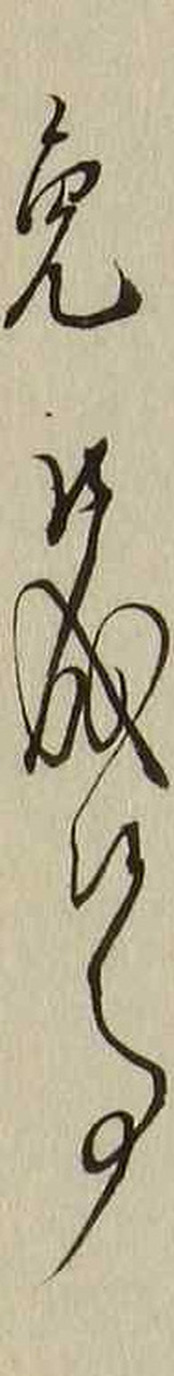免被成候事
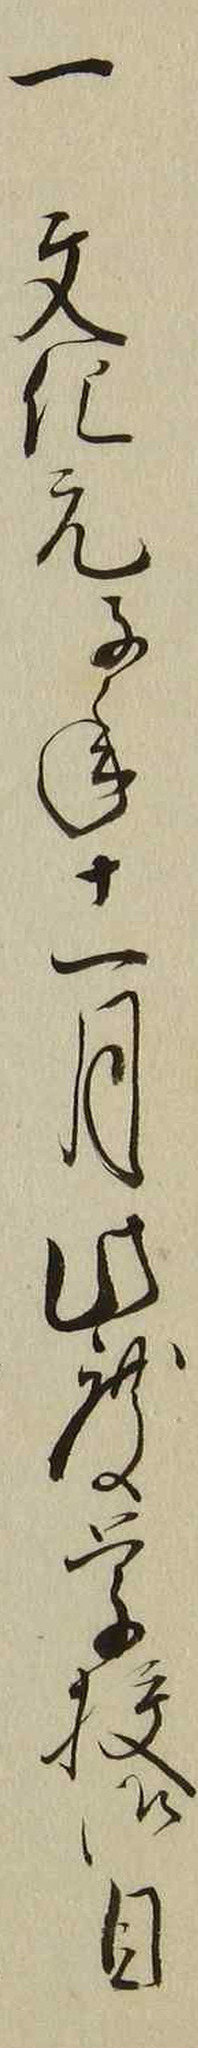一文化元子年十一月此度学校御目
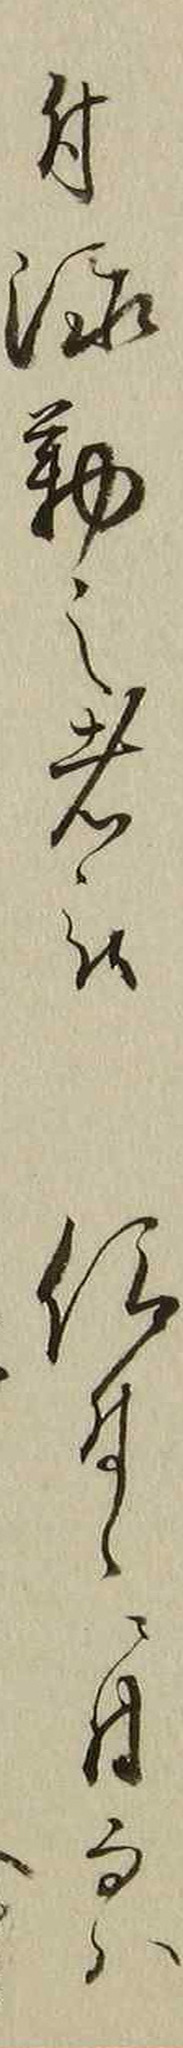付添勤之者被仰付候ニ付而ハ
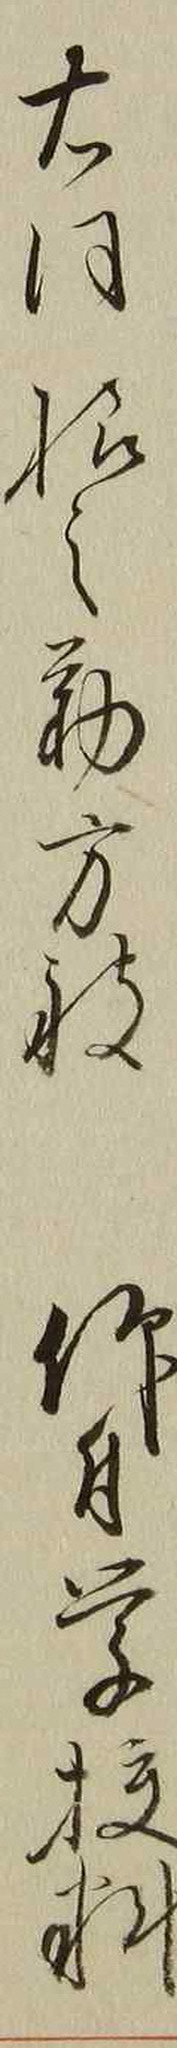右同様之勤方被仰付学校料
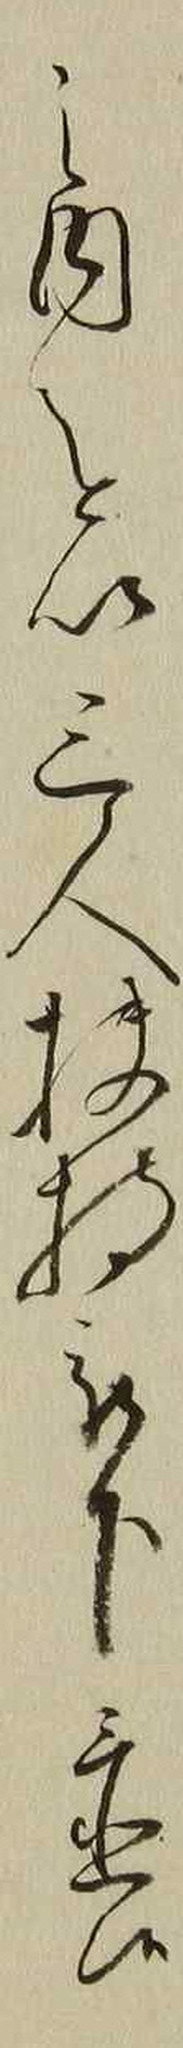之内を以三人扶持被下置候
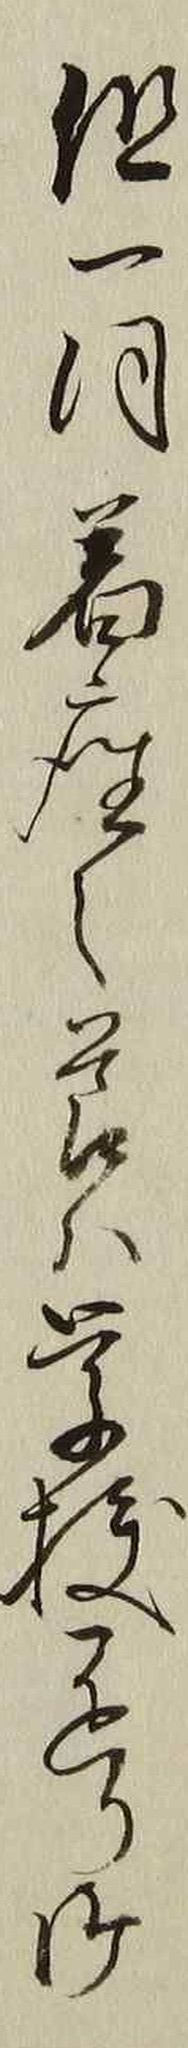但一同着座之節ハ学校懸り御
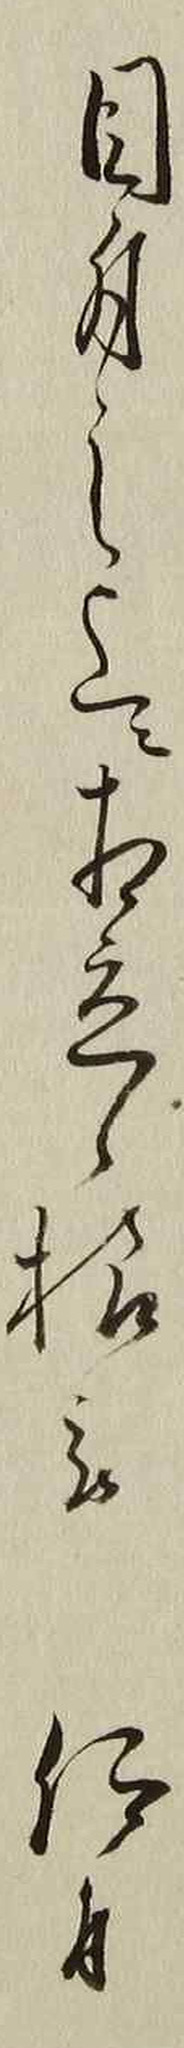目付之上ニ相立候様被仰付
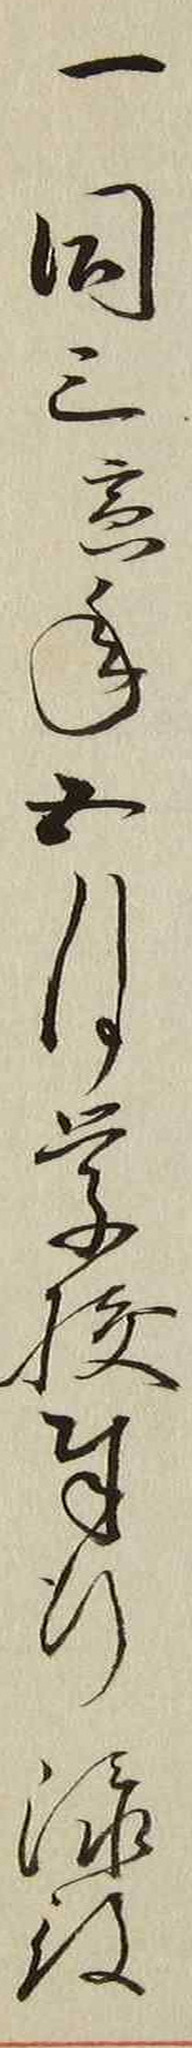一同三寅年五月学校奉行添役
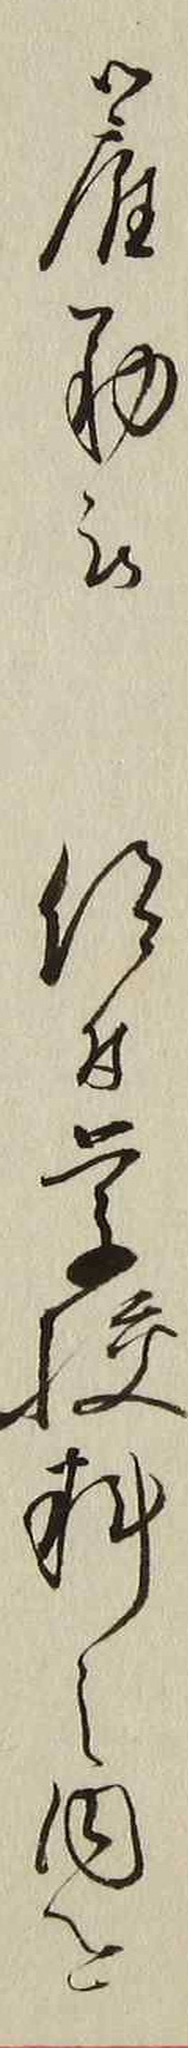御雇勤被仰付学校料之内を
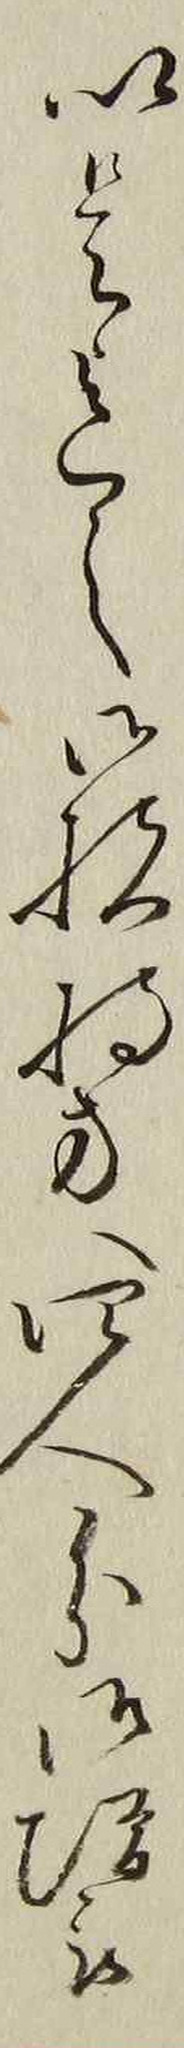以是迄之御扶持方へ四人分御増被
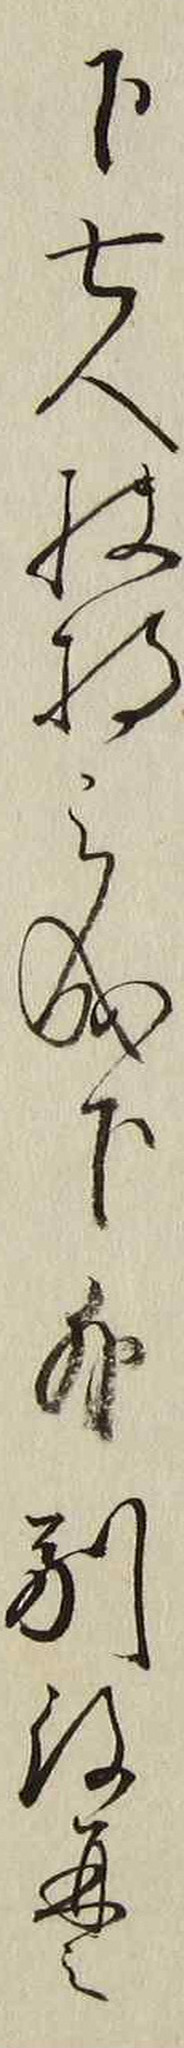下七人扶持被成下外別役再之
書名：諸士系譜　巻之2　い之部2
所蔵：会津若松市立会津図書館
